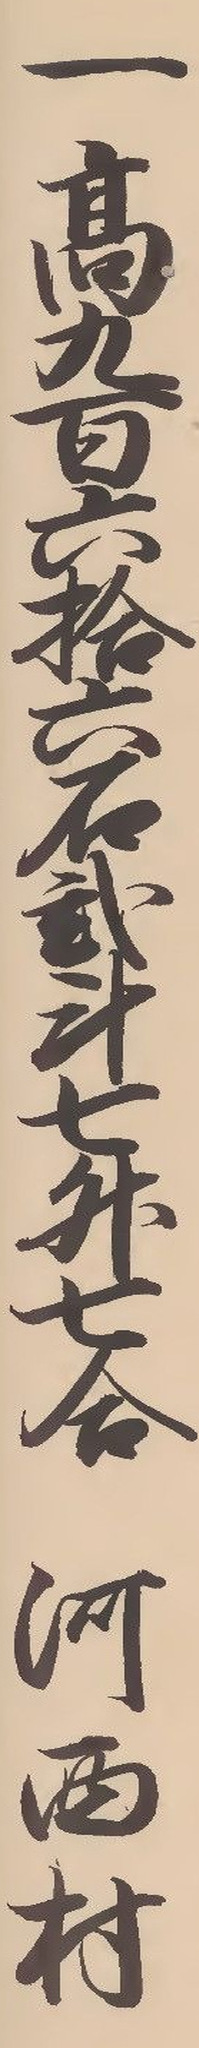一高九百六拾六石弐斗七升七合河西村
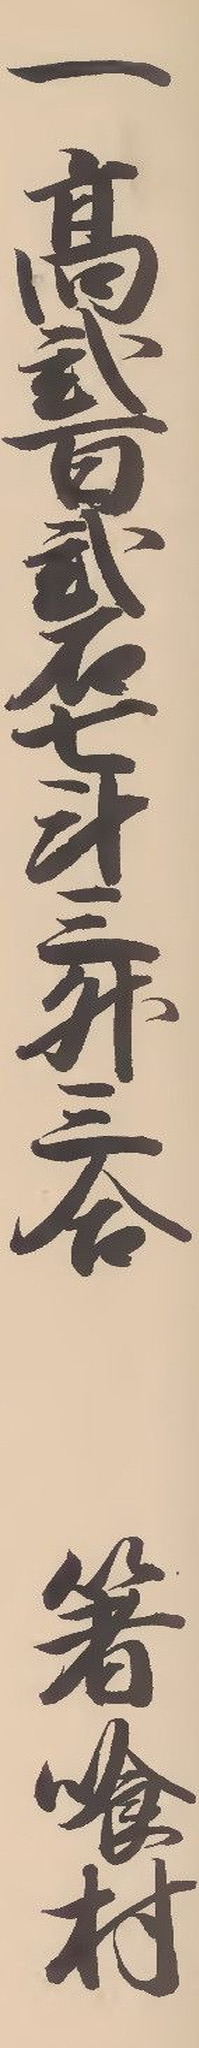一高弐百弐石七斗三升三合箸喰村
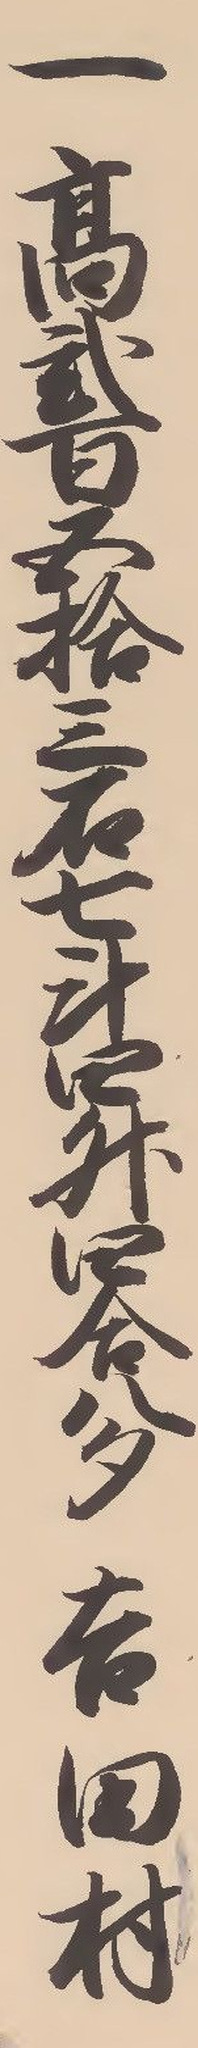一高弐百五拾三石七斗四升四合八勺吉田村
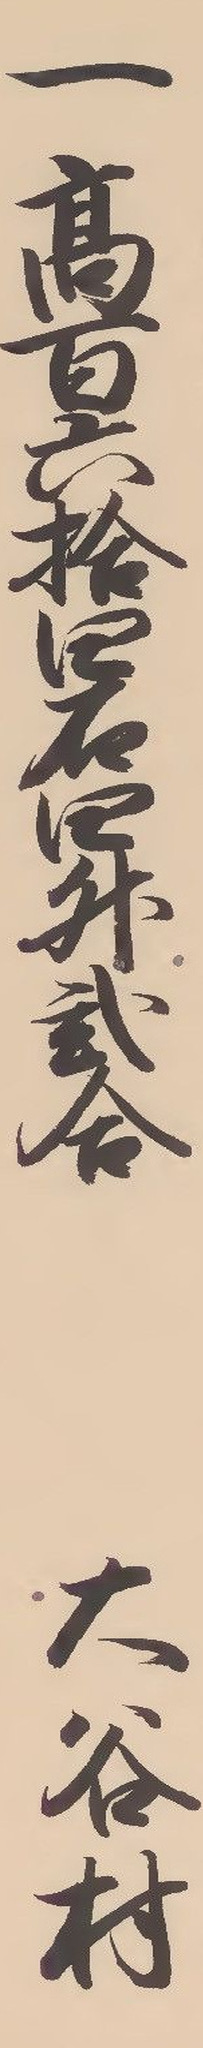一高百六拾四石四升弐合大谷村

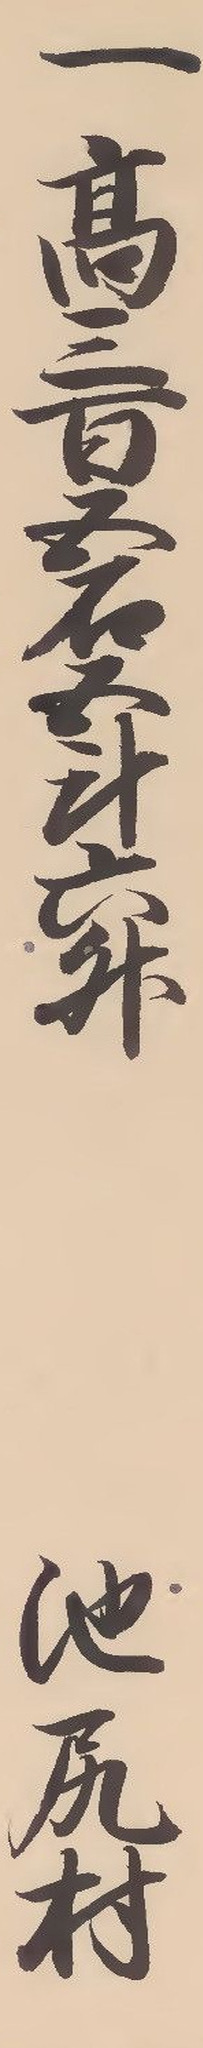一高三百五石五斗六升池尻村
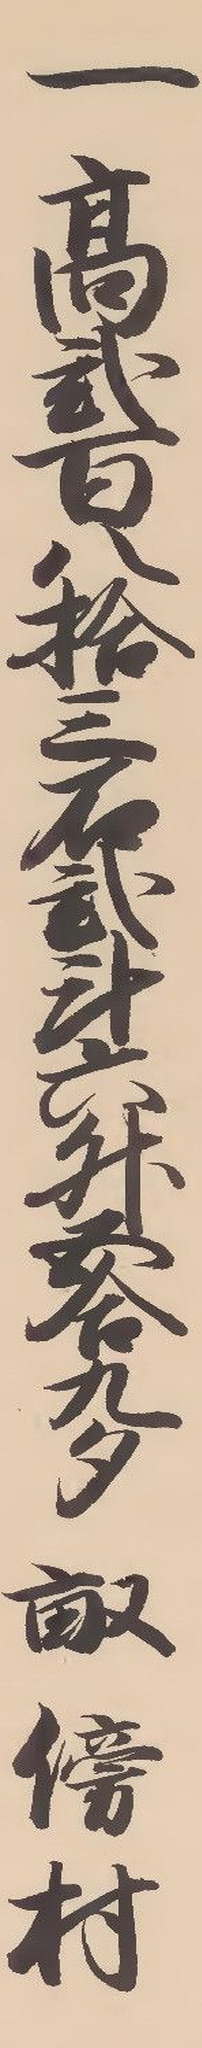一高弐百八拾三石弐斗六升五合九勺畝傍村
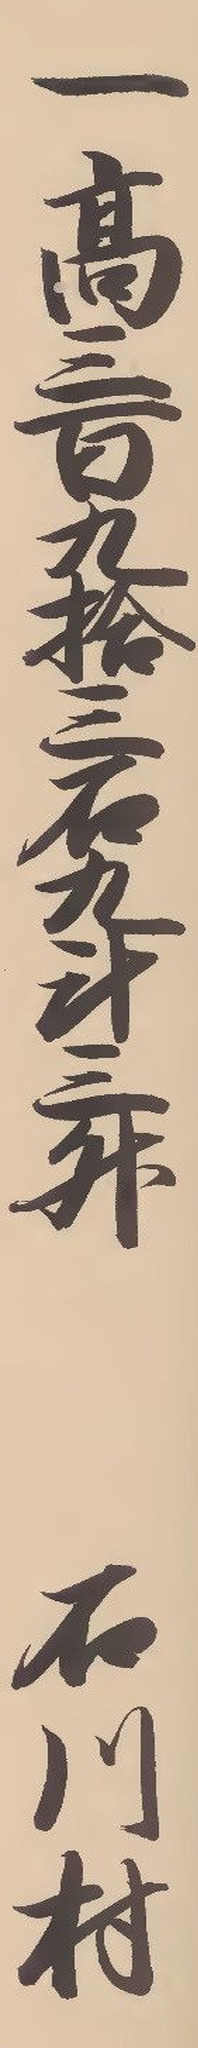一高三百九拾三石九斗三升石川村
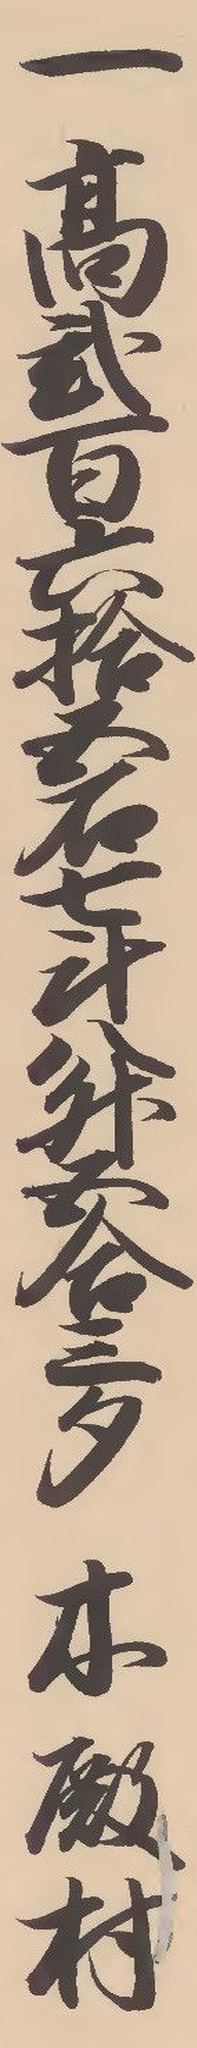一高弐百六拾五石七斗八升五合三勺木殿村
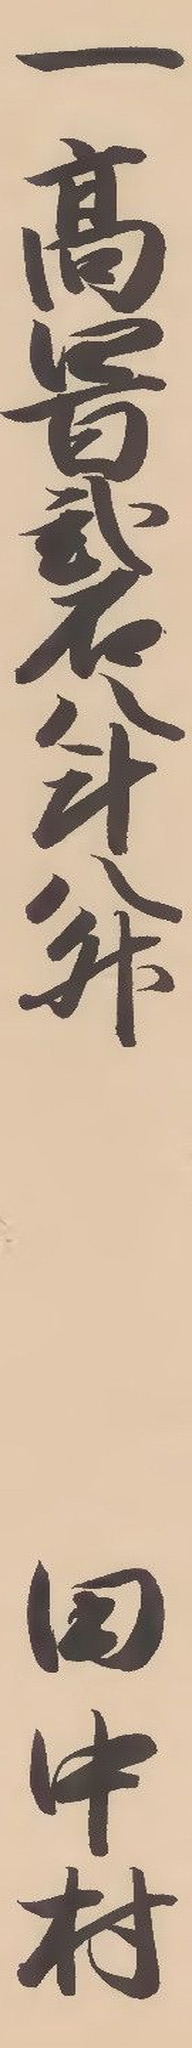一高四百弐石八斗八升田中村
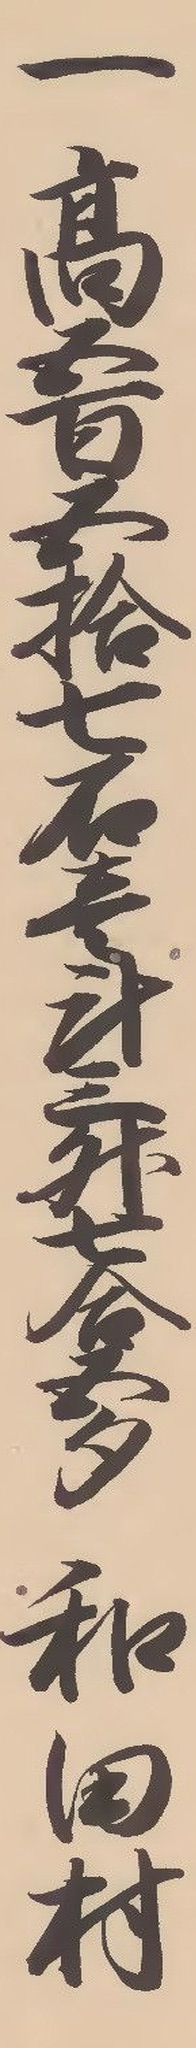一高五百五拾七石壱斗三升七合五勺和田村

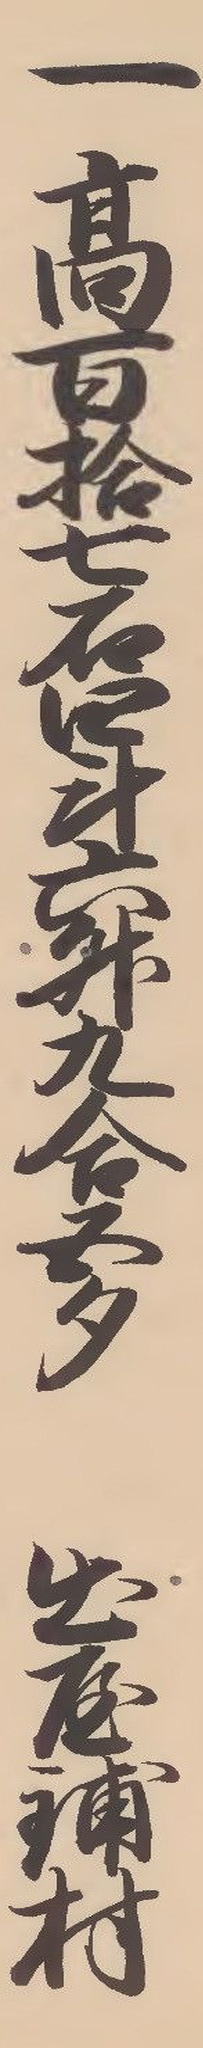一高百拾七石四斗六升九合五勺出屋鋪村
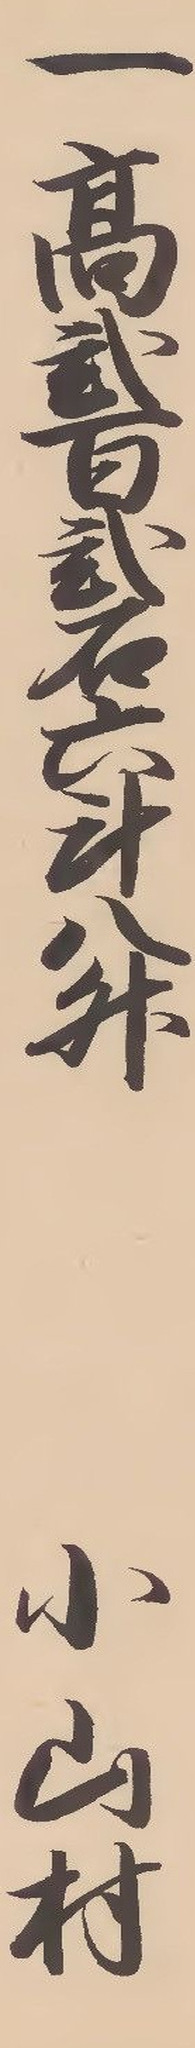一高弐百弐石六斗八升小山村
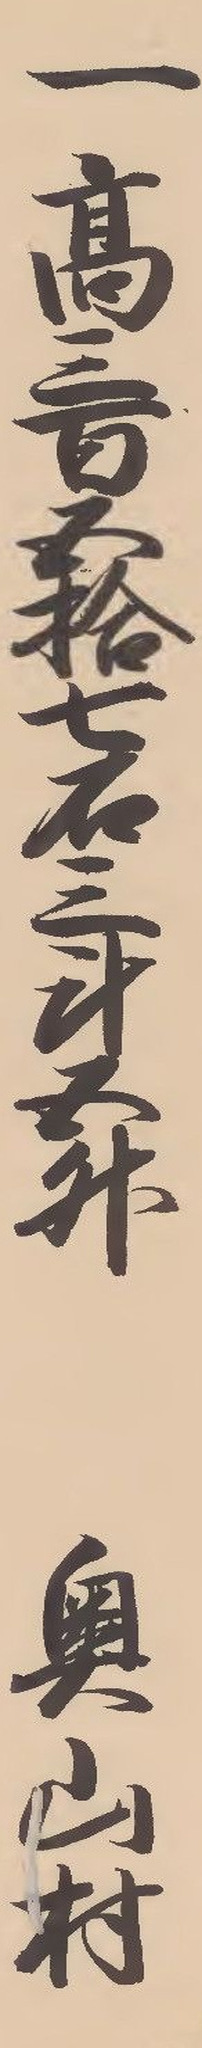一高三百五拾七石三斗五升奥山村
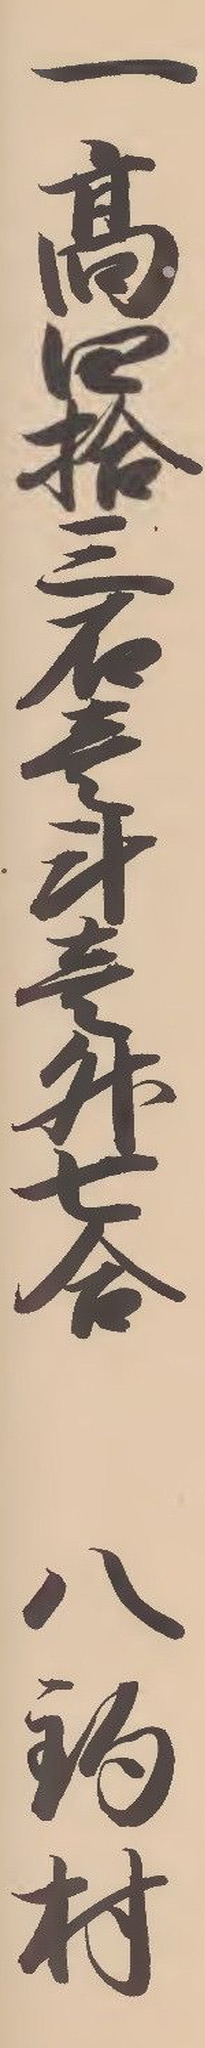一高四拾三石壱斗壱升七合八釣村
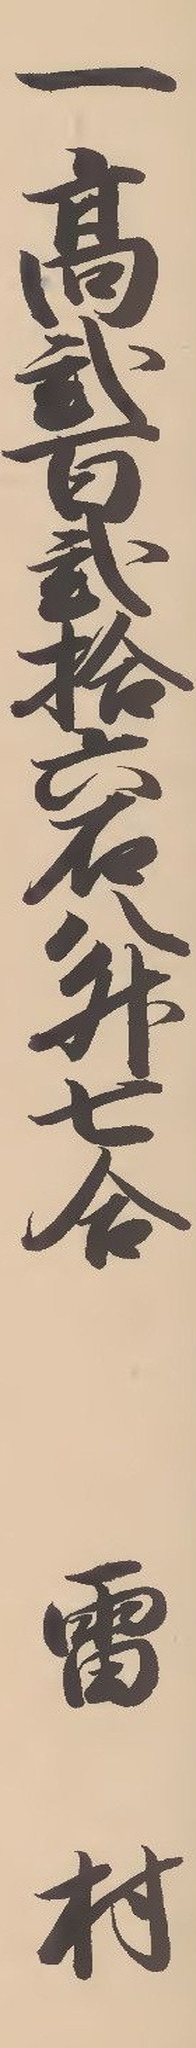一高弐百弐拾六石八升七合雷村
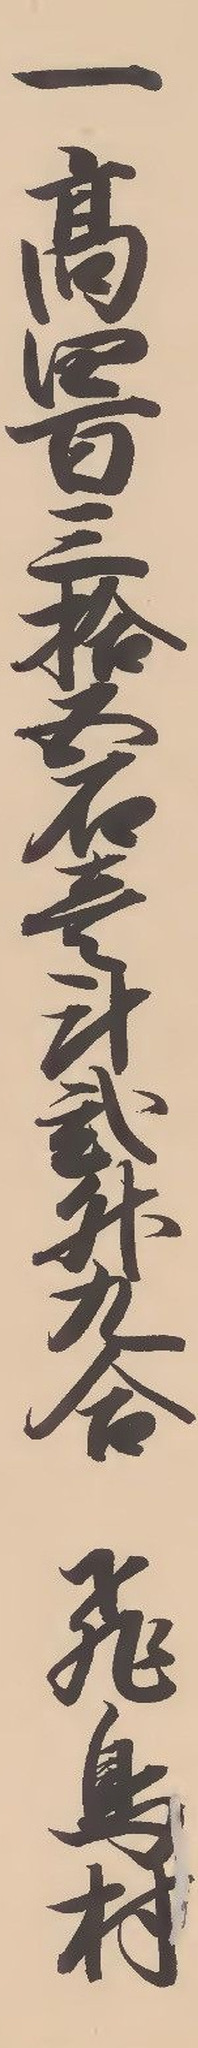一高四百三拾五石壱斗弐升九合飛鳥村
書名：大和国郷帳
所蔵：国立公文書館 National Archives of Japan
